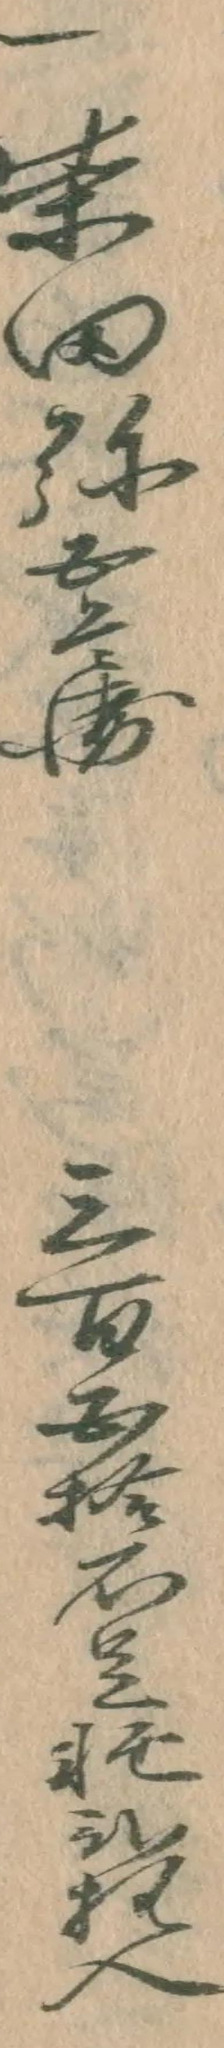一柴田弥五兵衛三百五拾石足軽弐拾人
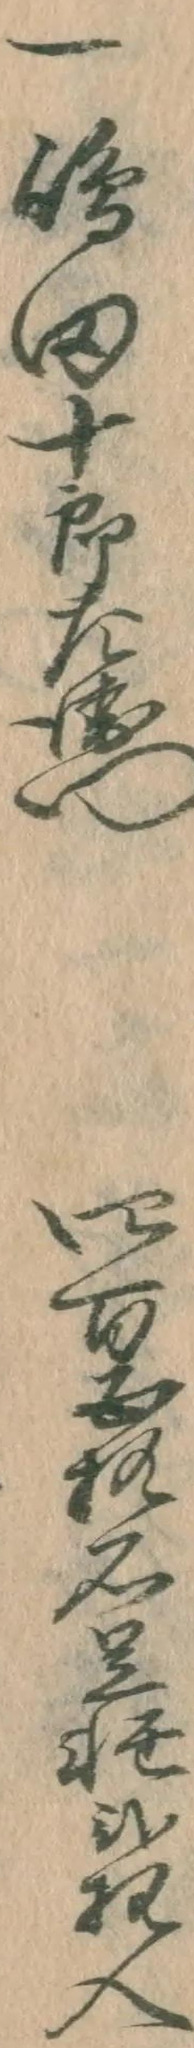一島田十郎左衛門四百五拾石足軽弐拾人
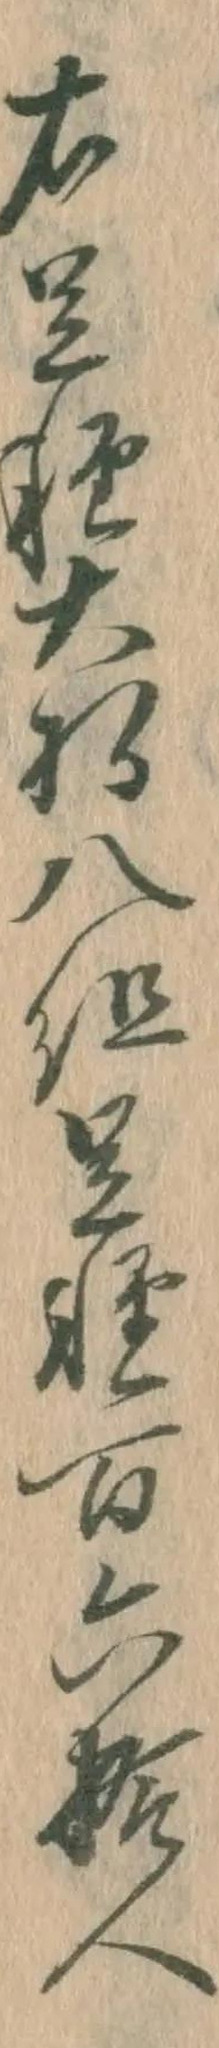右足軽大将八組足軽百六拾人
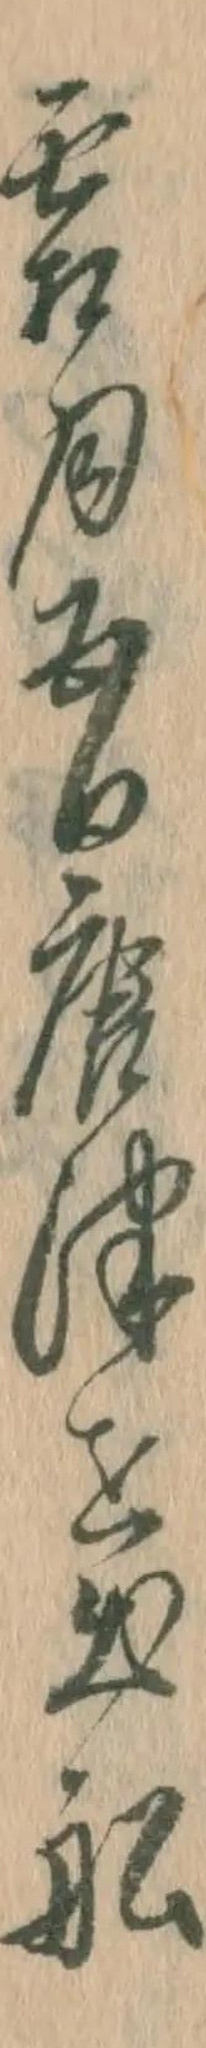霜月五日唐津を出舩
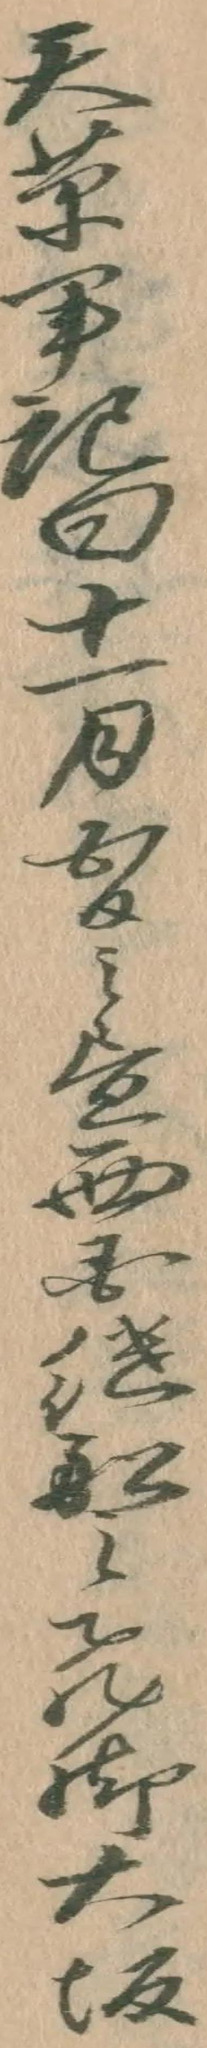天草軍記曰十一月五日之昼西国鑓舩之飛脚大坂
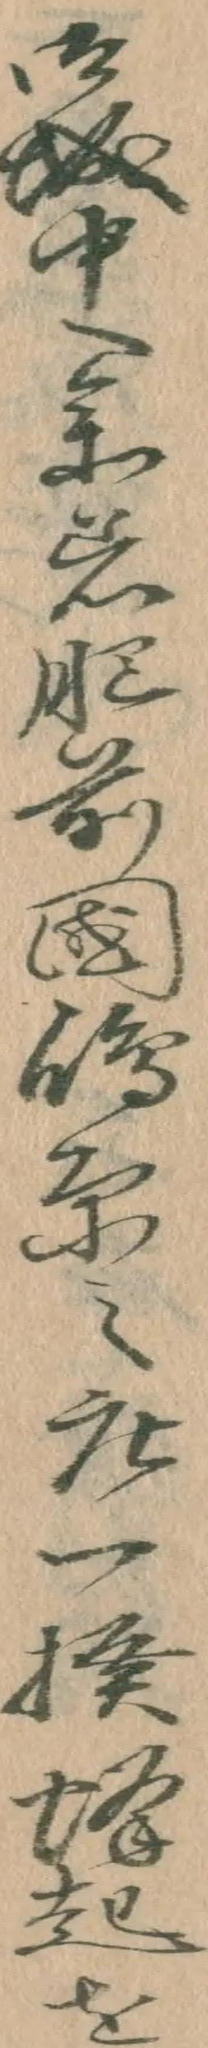御城中へ参着肥前国島原之庄一揆蜂起を
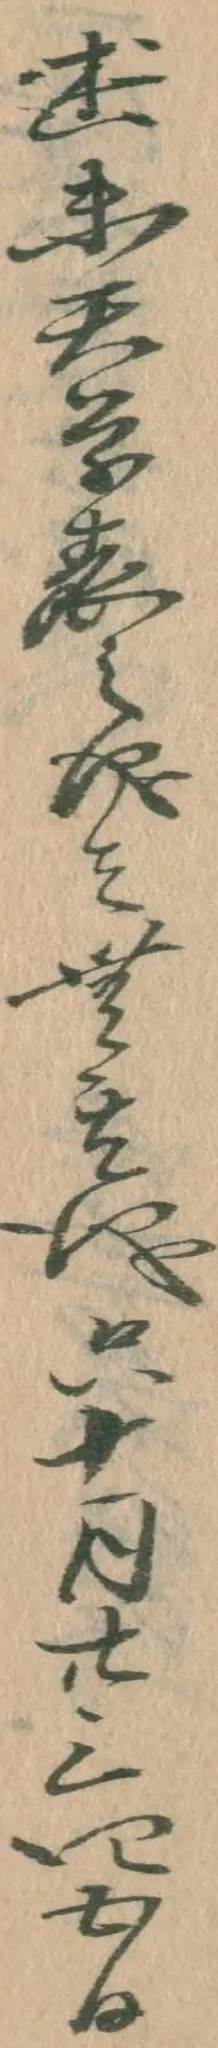述未天草表之儀を無其儀只十月廿三四五に日
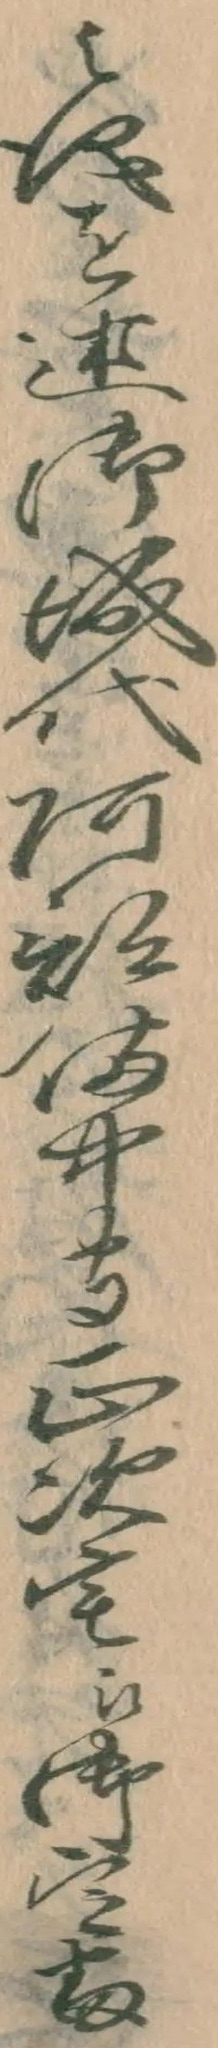之儀を述御城代阿部備中守正次宅江御定番
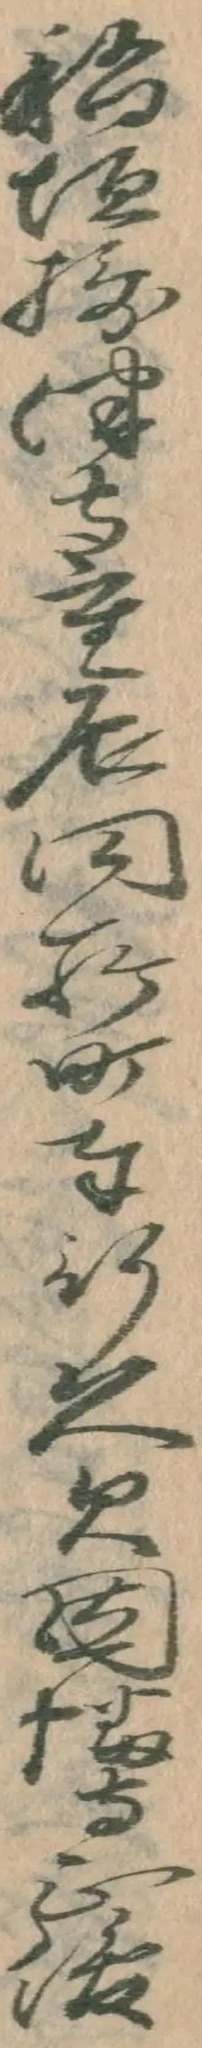稲垣摂津守重辰同所町奉行久貝因幡守正俊
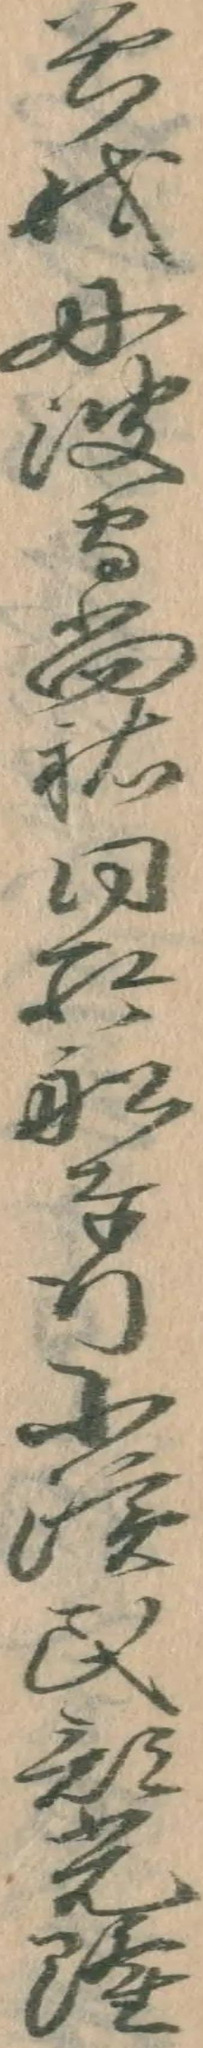曽我丹波守尚祐同於舩奉行小濱民部光隆
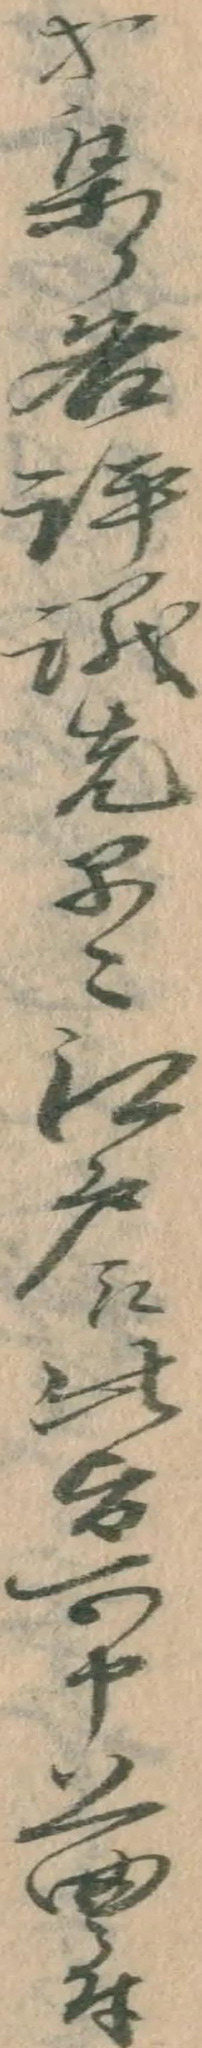等集り各評議先早々江戸江此旨可申上由に付
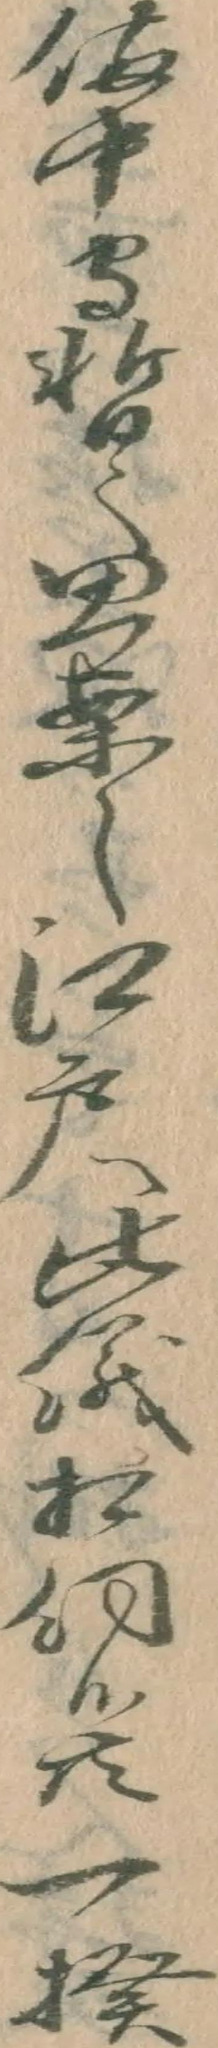備中守暫く思案し江戸へ此儀相伺候共一揆
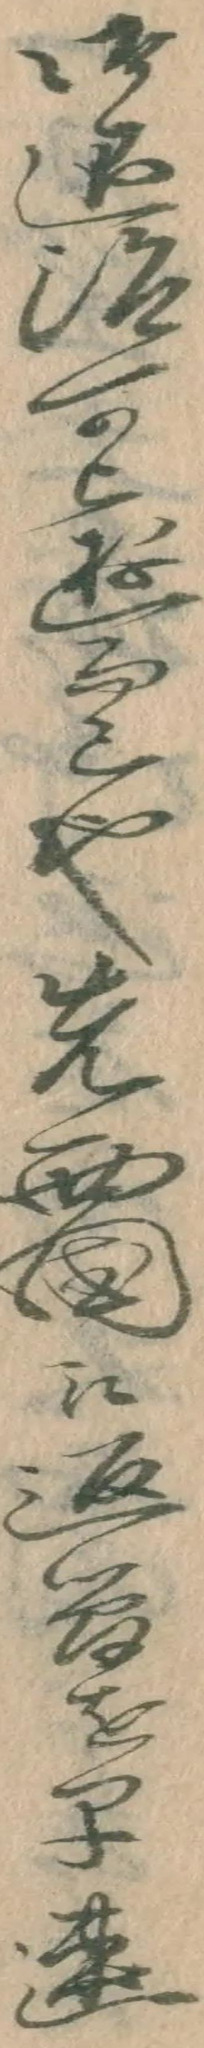御退治可被遊而己也先西国江返簡を早速
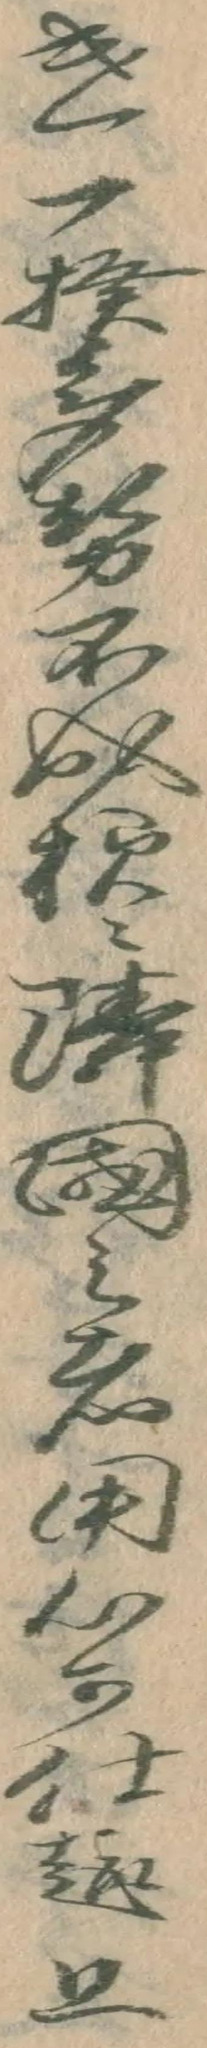遣一揆多勢不成様に隣国之者用心可仕趣且
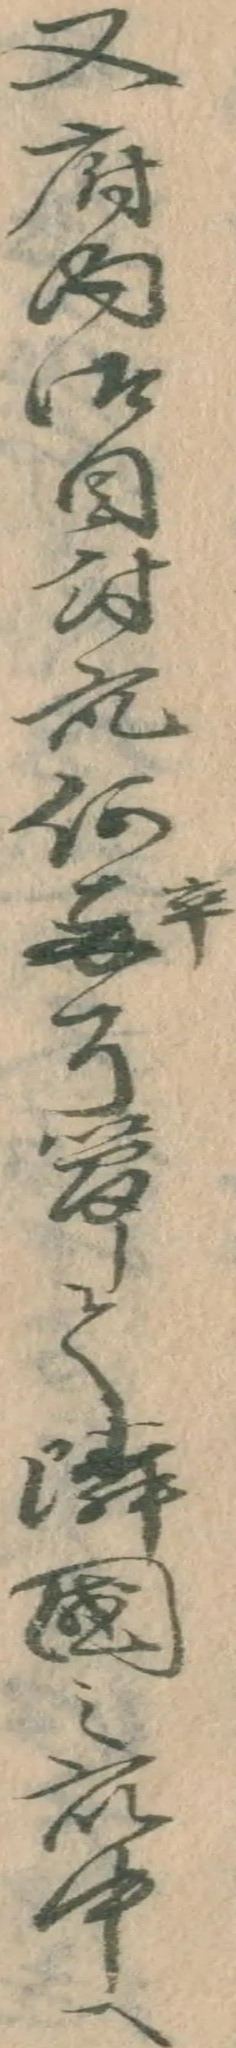又府内御目付衆何卒了簡して隣国之衆中へ
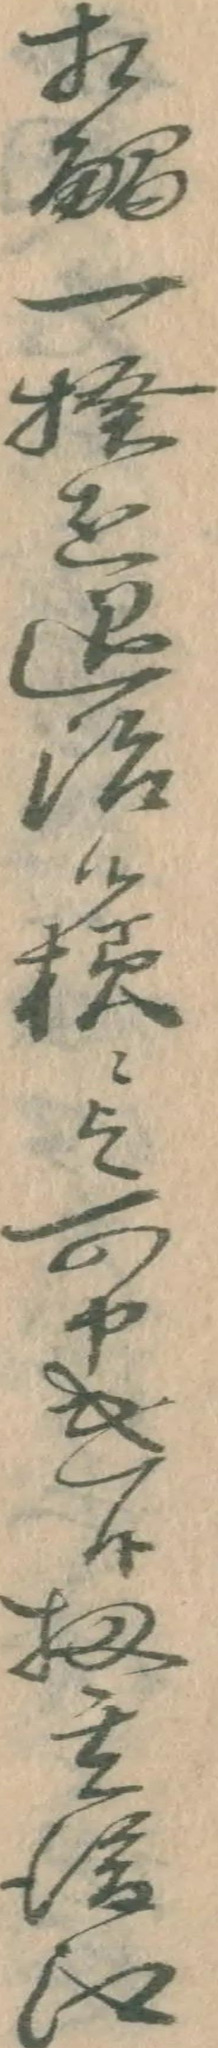相触一揆を退治候様に与可申遣候扨其後江
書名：切支丹御退治記 49巻. [2]
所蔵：国立国会図書館 National Diet Library, JAPAN
